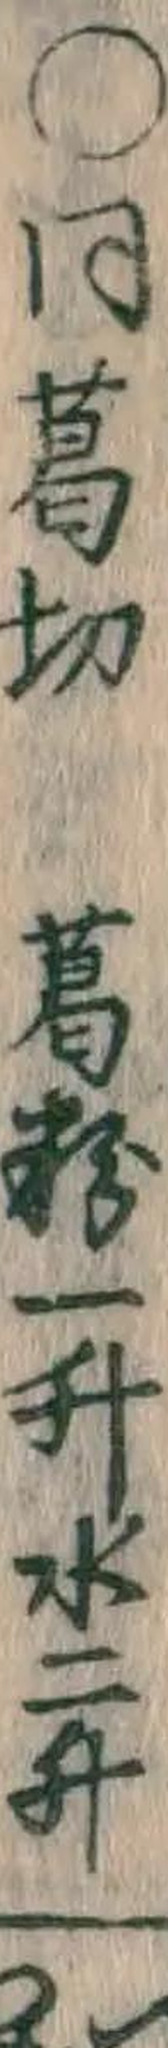○同葛切葛粉一升水二升
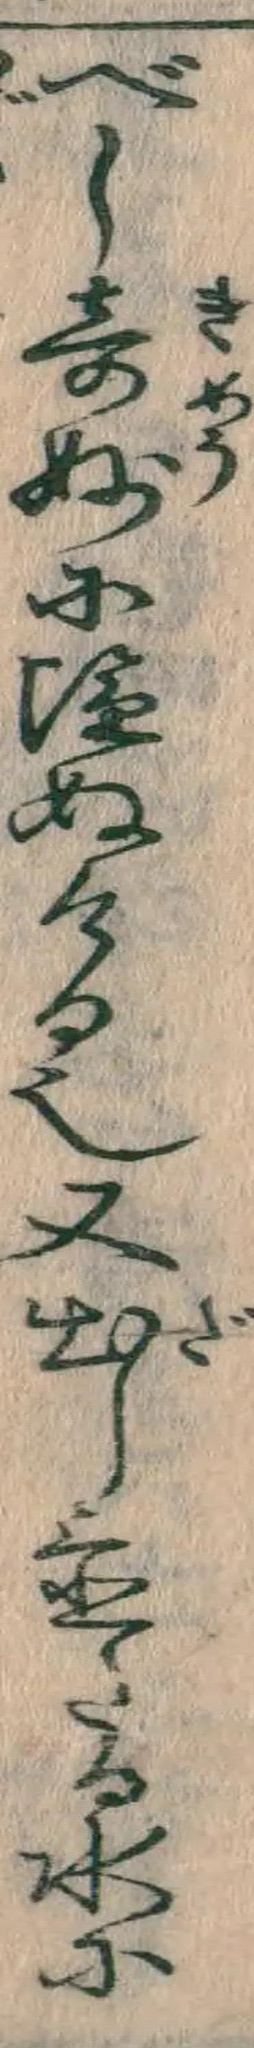べし奇妙に塩ぬける也又出し置たる水に
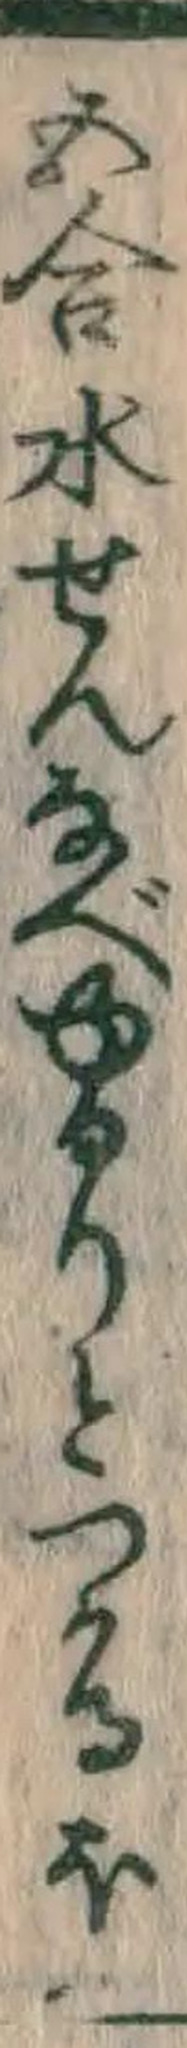五合水せんなべゆるりとつかるほ
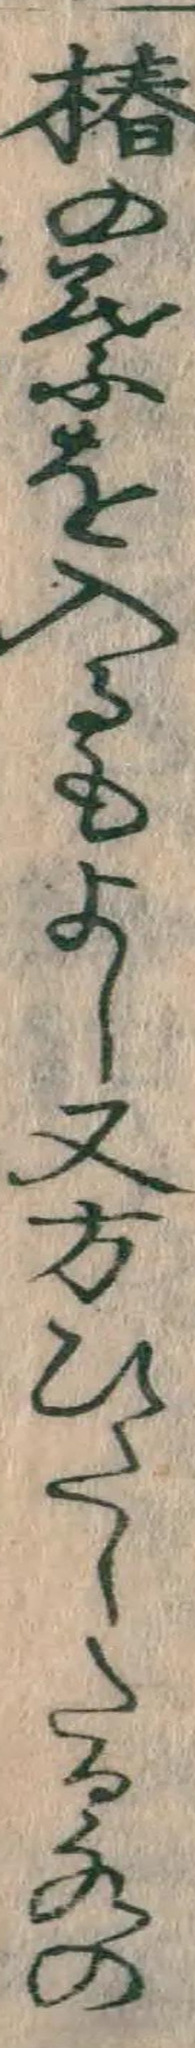椿の葉を入るもよし又方ひたしたる水の
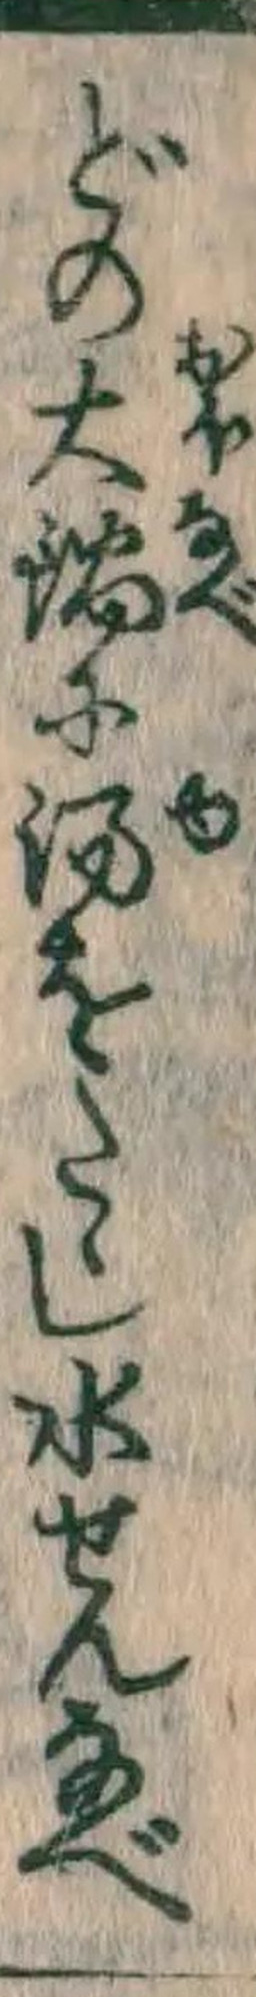どの大鍋に湯をたゝし水せんなべ
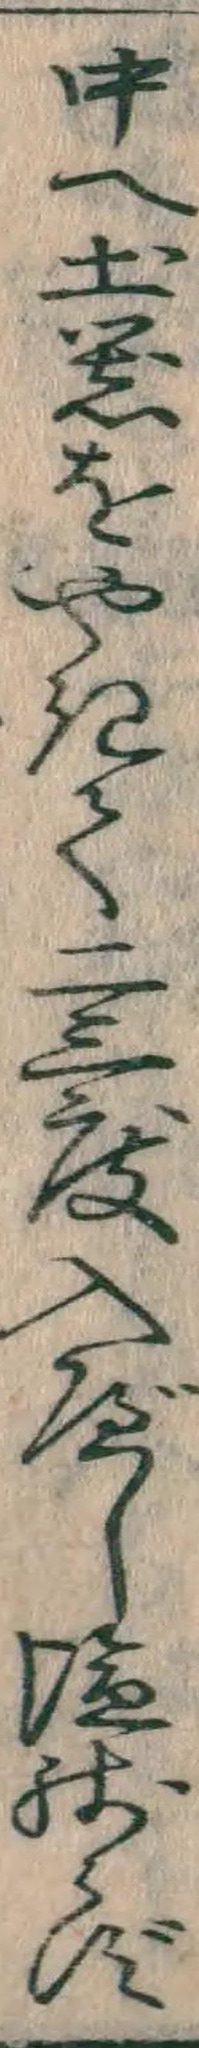中へ土器をやきて二三度入べし塩残らず
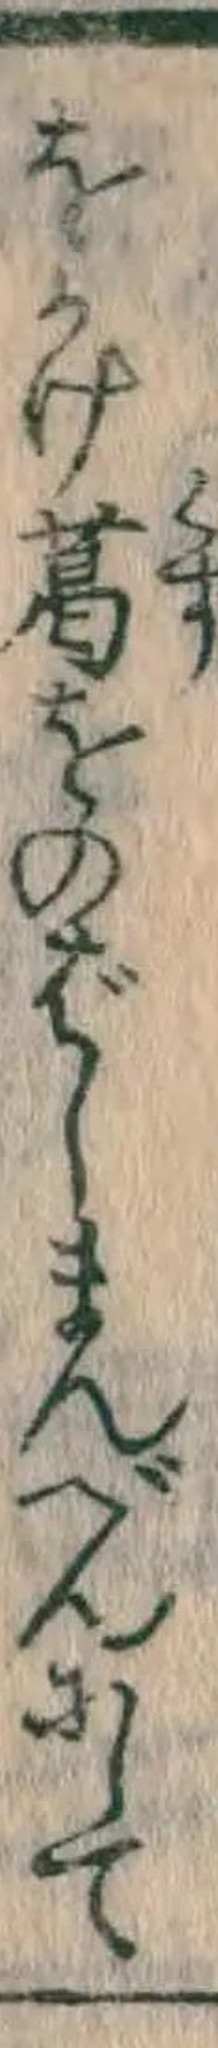をかけ葛をのばしまんべんにして
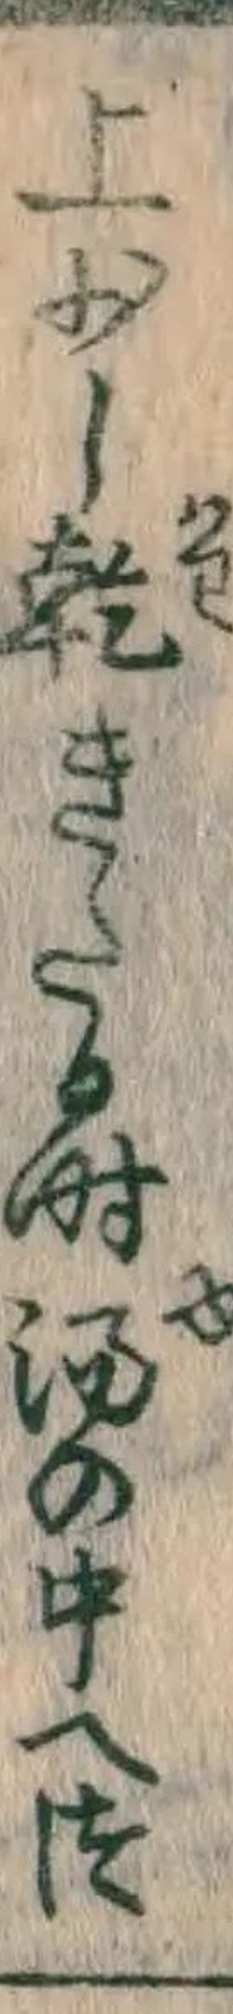上少し乾きたる時湯の中へつ
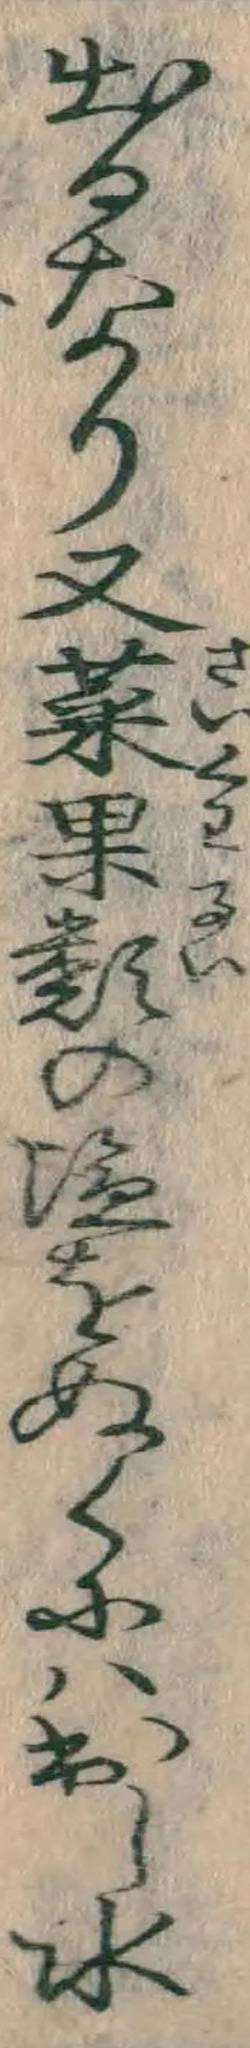出るなり又菜果類の塩をぬくには出し水
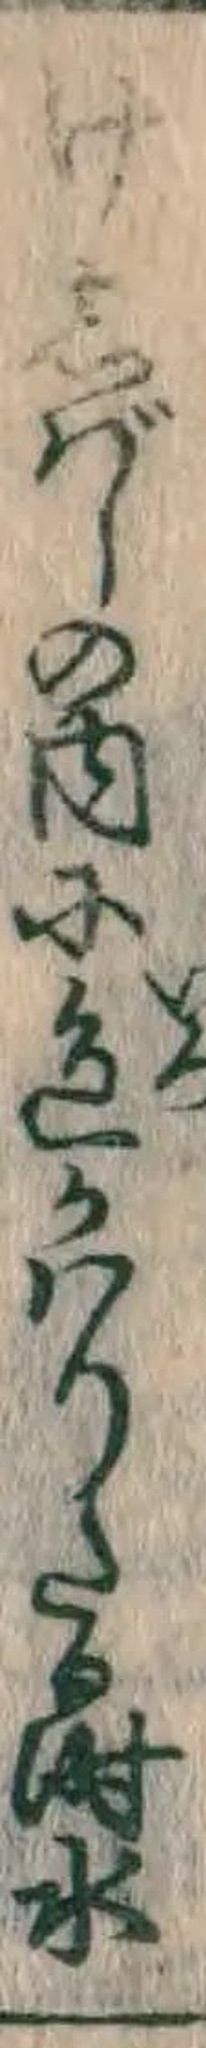けしばしの内に色かはりたる時水
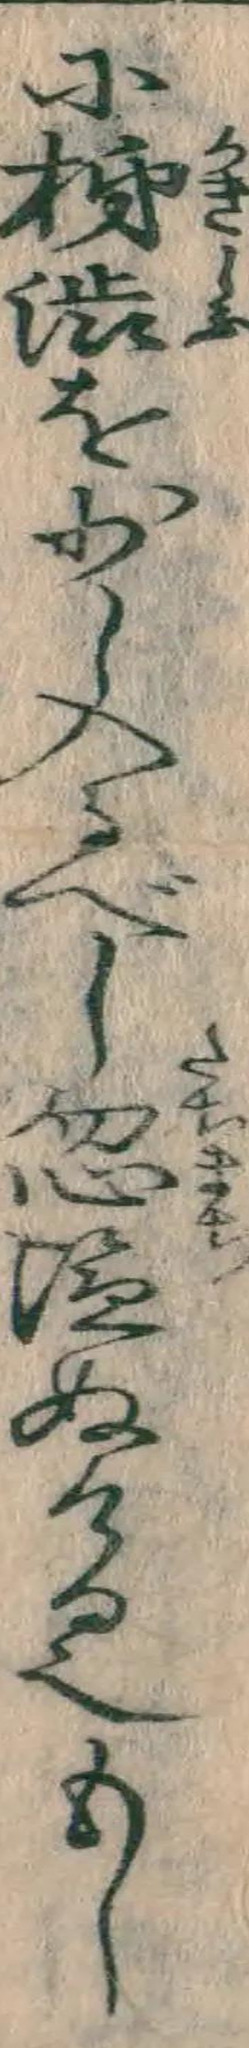に柿渋を少し入るべし忽塩ぬける也もし
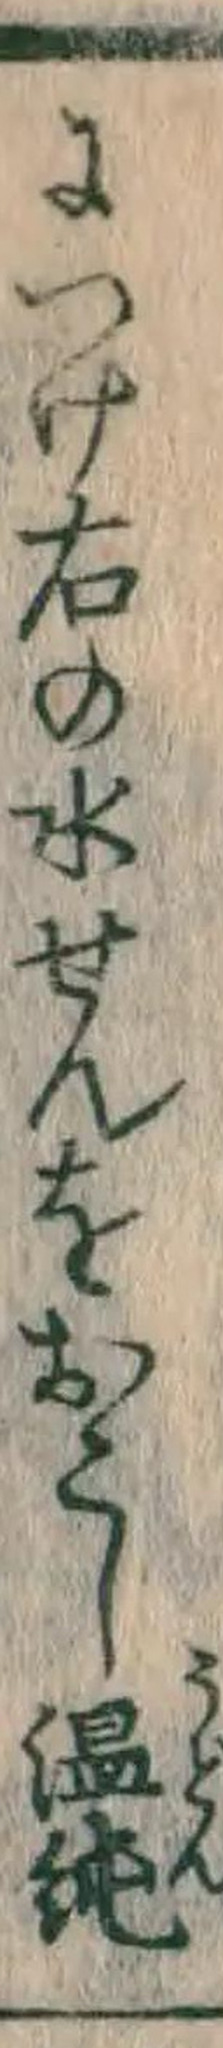につけ右の水せんをおこし温飩
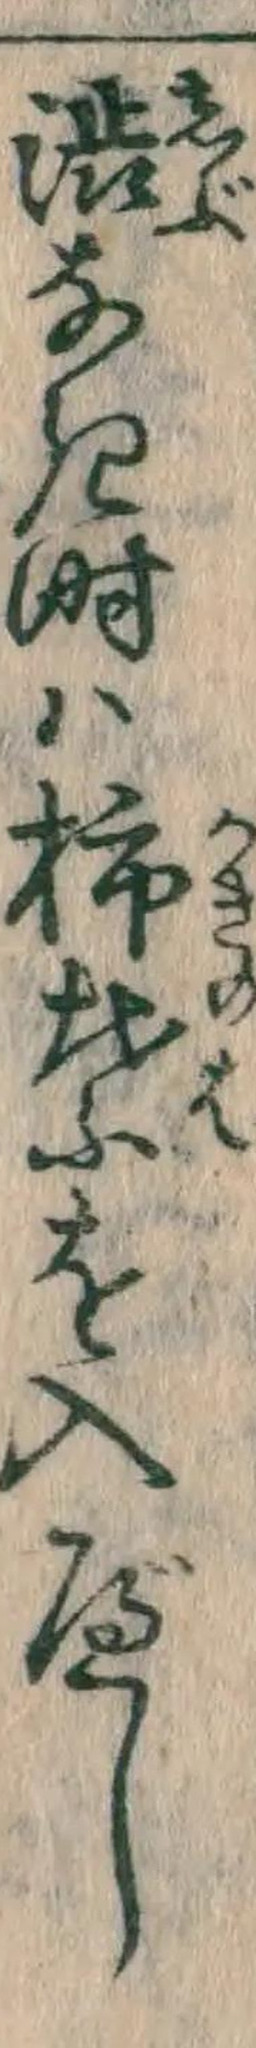渋なき時は柿葉を入べし
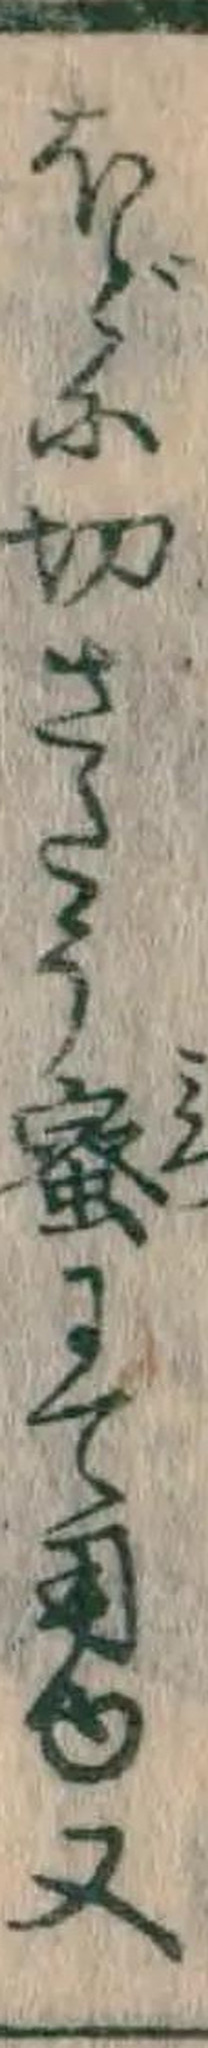ほどに切さたう蜜にて用ゆ又
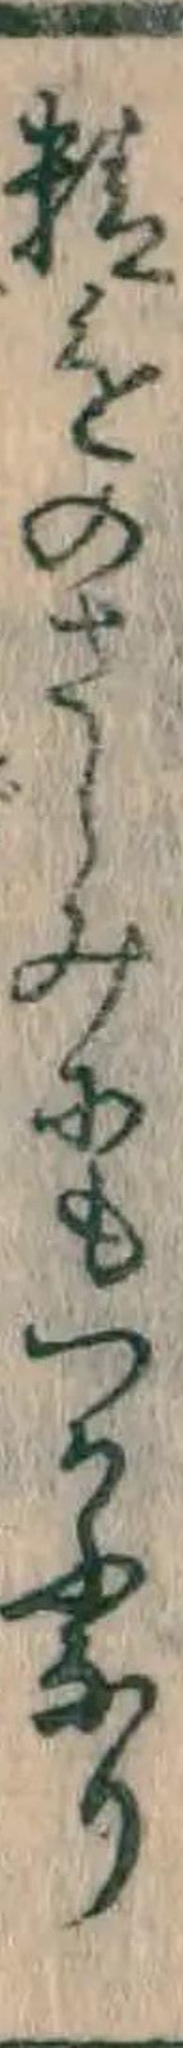精進のさしみにもつかふなり
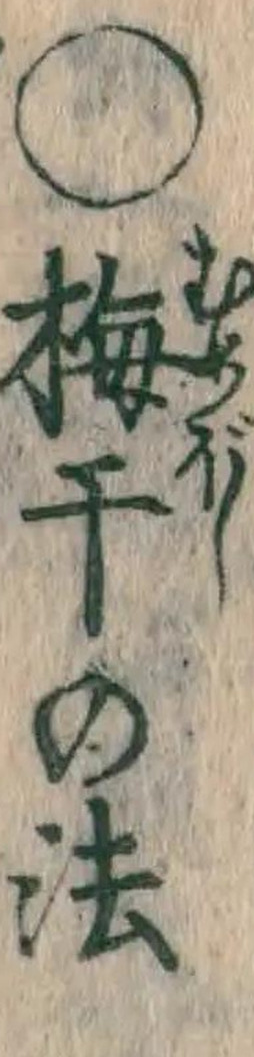○梅干の法
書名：広益秘事大全 3巻. [5]
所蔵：国立国会図書館 National Diet Library, JAPAN
